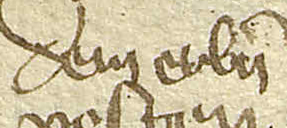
dem erbn*
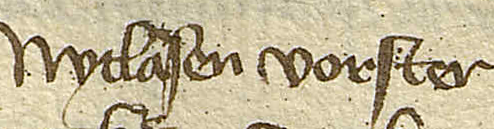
Nyclaſen vorſter
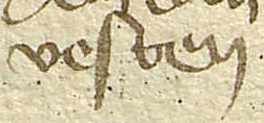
veſten
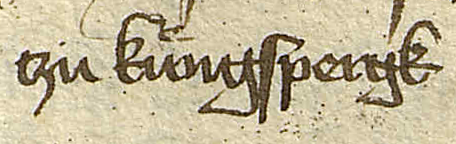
cʒu küngſpergk
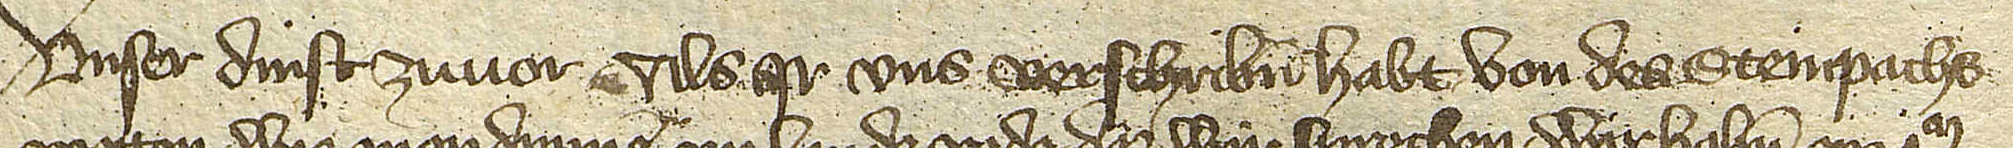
Vnſer dinſt cʒuuor / Als Ir vns verſchribn* habt von des Steinpachs
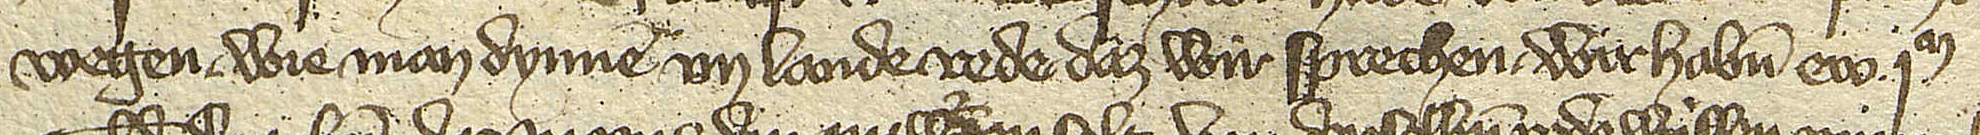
wegen / wie man dynne im lande rede / daʒ wir ſprechen / wir habn* ew i*
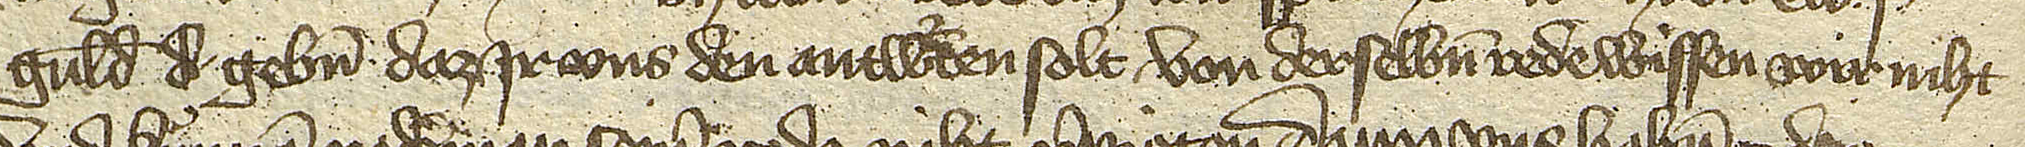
guld* d gebn* daʒ Ir vns den antw*ten ſolt / von derſelbn* rede wiſſen wir niht
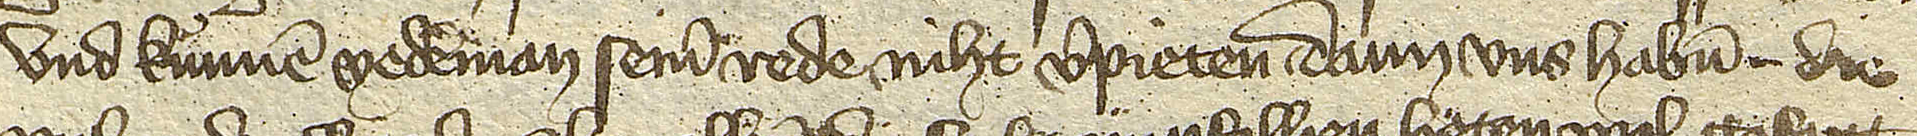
vnd künne* yede*man ſein* rede niht v*pieten / dann vns habn* ~ die
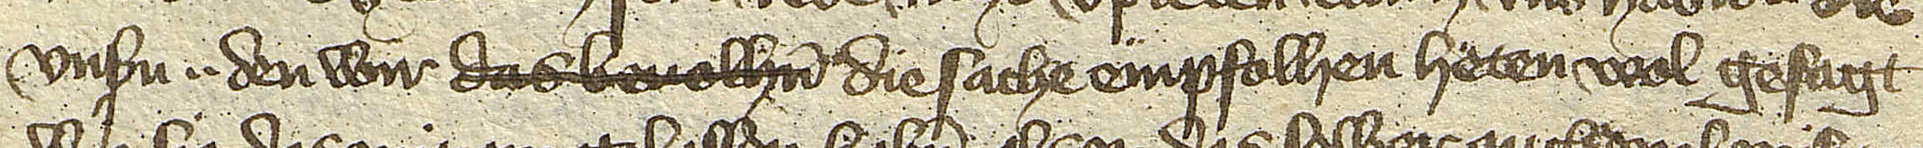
vnſ*n ~ den wir das beuolhn* die ſache empfolhen heten wol geſagt
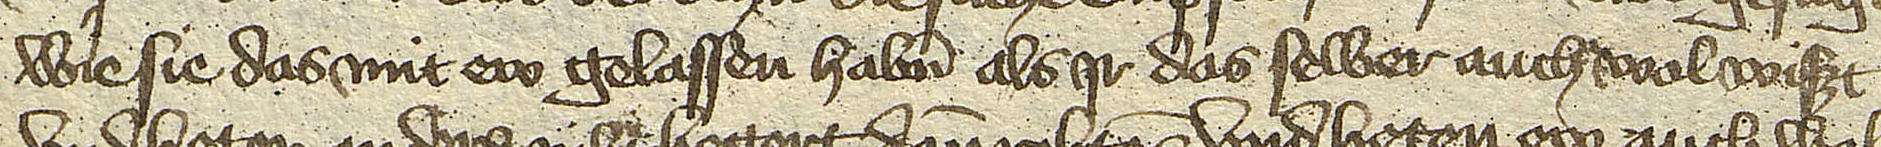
wie ſie das mit ew gelaſſen habn* als Ir das ſelber auch wol wiſʒt
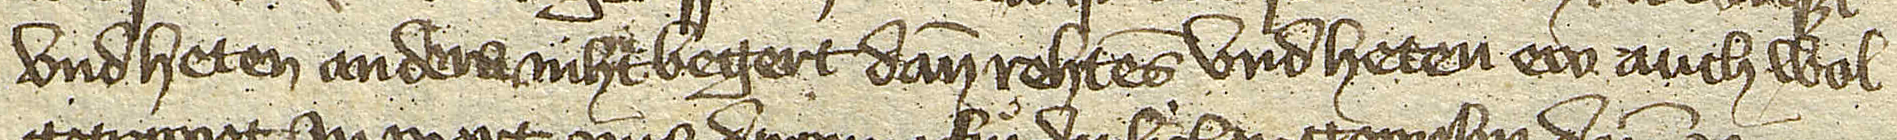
vnd heten anders niht begert dan* rehtes* vnd heten ew auch wol
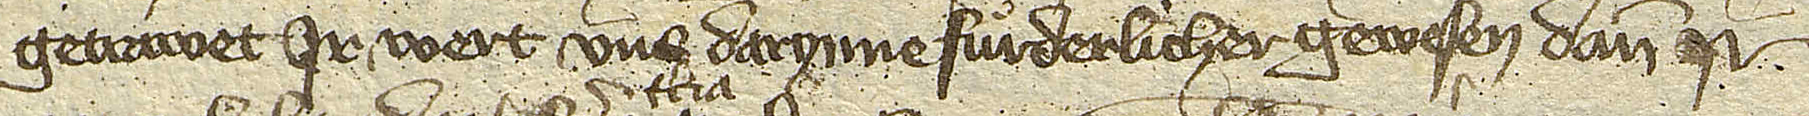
getrawet Ir wert vns darynne fürderlicher geweſen dan* Ir
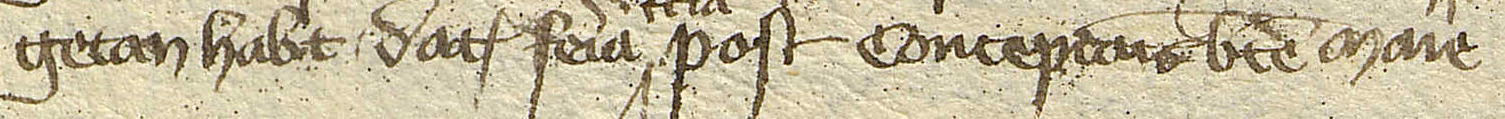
getan habt / dat* feia* poſt Concepcois* bte* Maie*
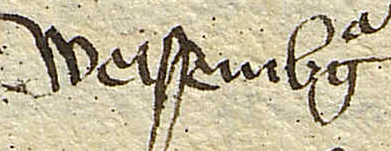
Weiſſemb*g
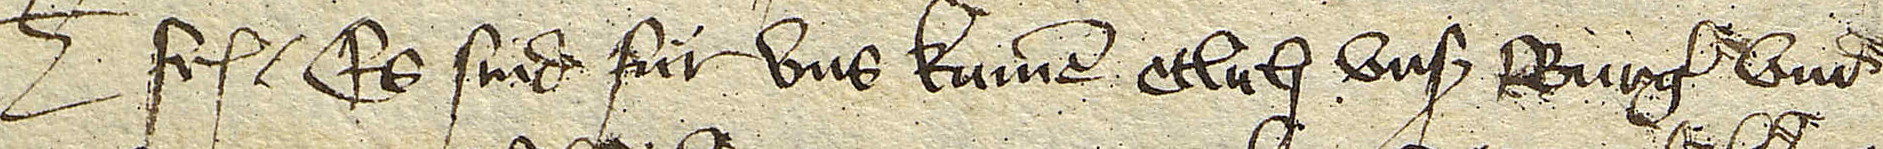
L* fr* / Es ſind für vns kume* etlich vnſ* Burg* vnd
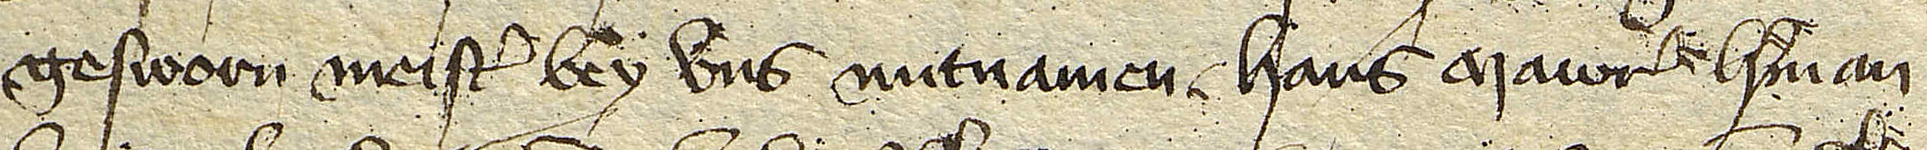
geſworn meiſt* bey vns mitnamen / hans Mawr* h*man
